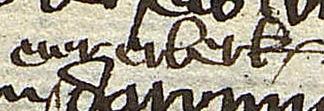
ewr erberk*
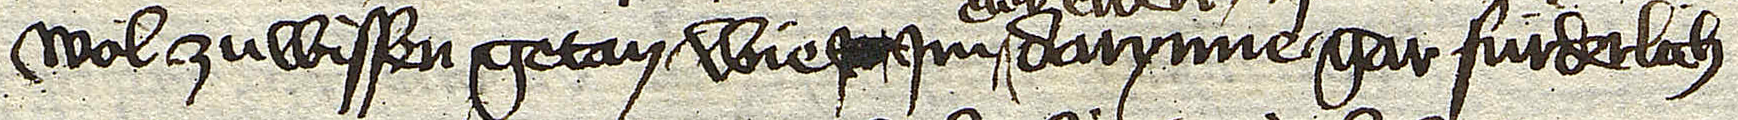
wol cʒu wiſſen getan / wie Ir Im darynne gar fürderlich
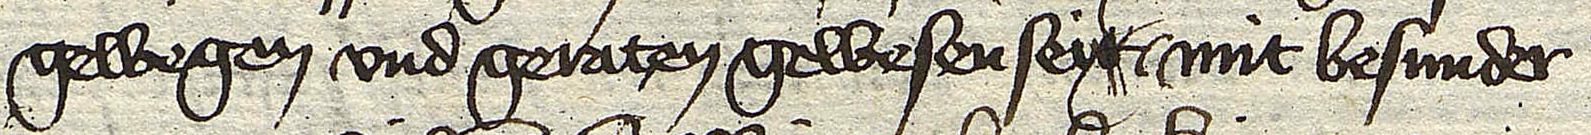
gewegen vnd geraten geweſen ſeyt / mit beſunder
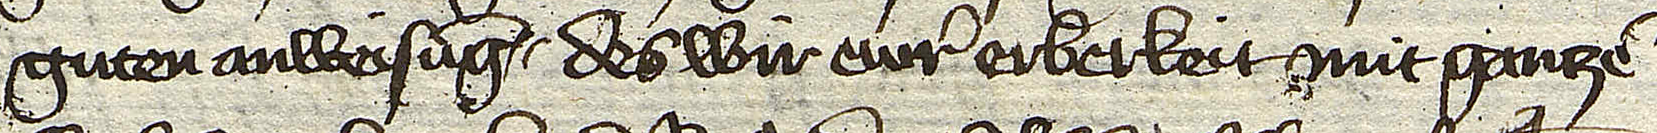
guten anweiſug* / des wir ewr* erberkeit mit gancʒe*
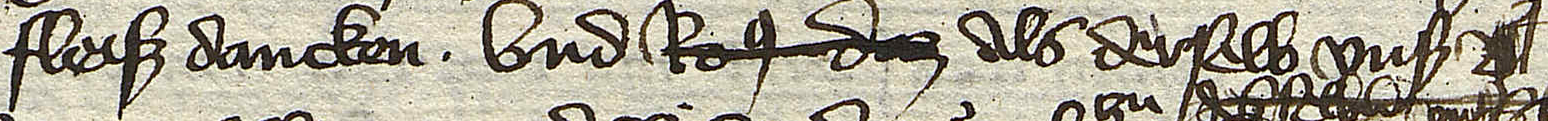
fleiſʒ dancken . vnd Ro* daʒ als derſelb vnſ* B*
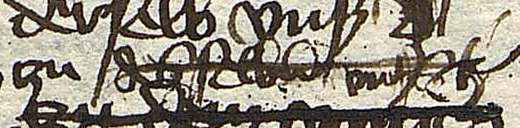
cʒu desſelb*n vnſ%% %*
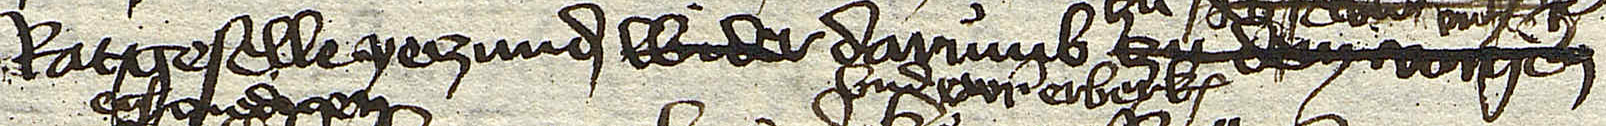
Ratgeſelle yecʒund* wider darümb cʒu dem vorgen*
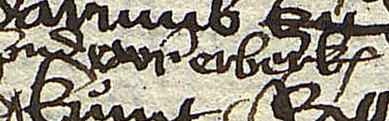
vnd ew*r erberk*
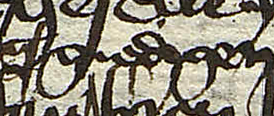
eg* gnedigen
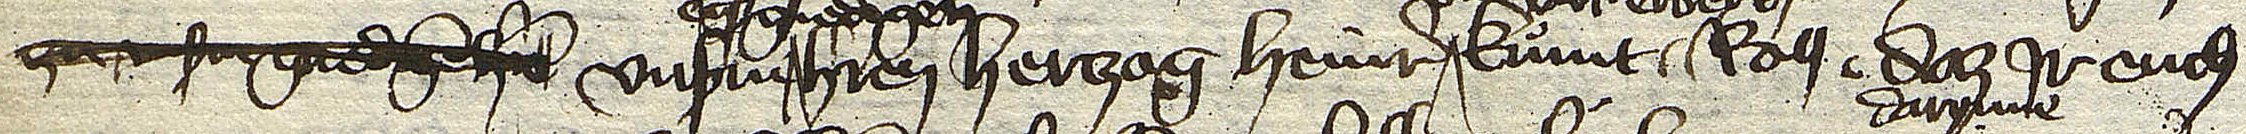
cʒu vnſ*m gnedige* h*re vnſ*m h*ren hercʒog heinr* kümt / Ro* / daʒ Ir euch
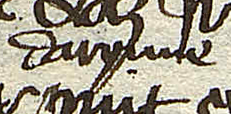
darynne
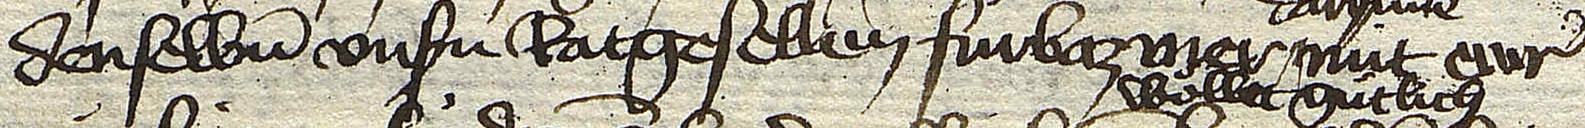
denſelb*n vnſ*n Ratgeſellen fürbaʒ mer mit ew*r
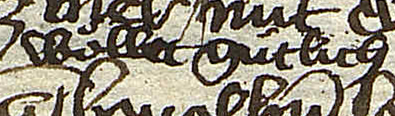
wöllet gütlich
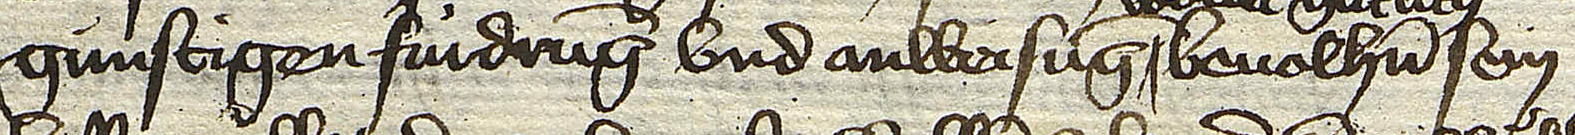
günſtigen fürdru*g vnd anweiſu*g beuolh*n ſein
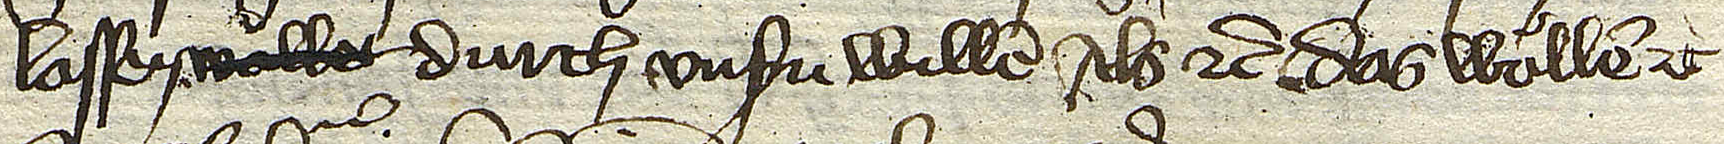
laſſen wöllet durch vnſ*n wille* Als ec* / das wölle* ec*
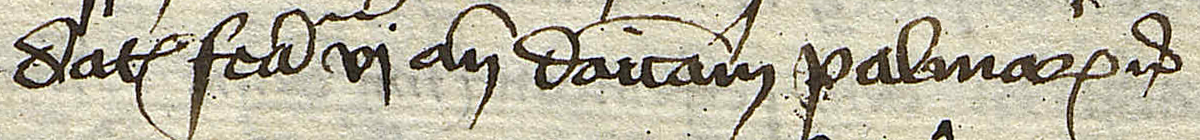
dat* fea* vi* an* doicam* palma* §
